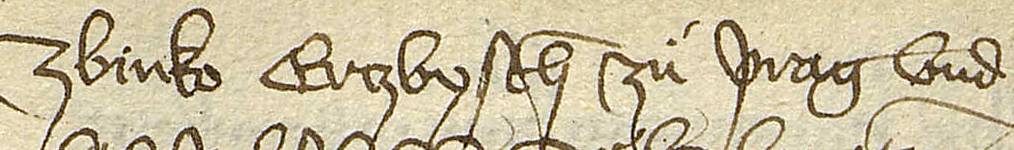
CƷvinko Ercʒbyſch* cʒü Prag vnd
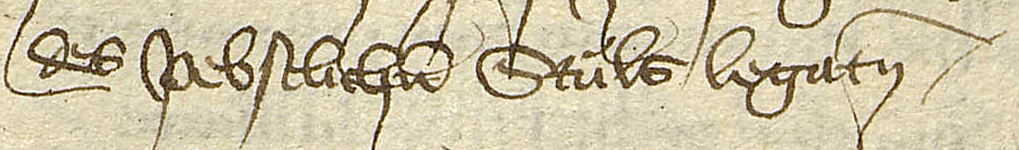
des Pebſtlichn* Stüls legatn* /
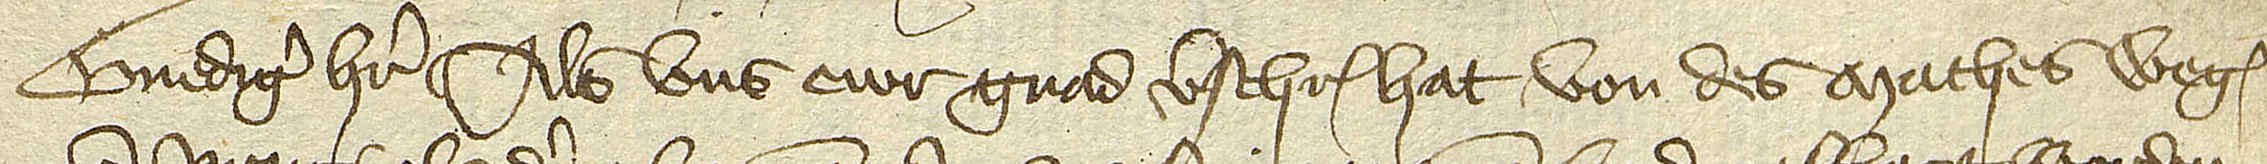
Gnedig* hr* / Als vns ewr gnad v*ſchr* hat / von des Mathes weg*
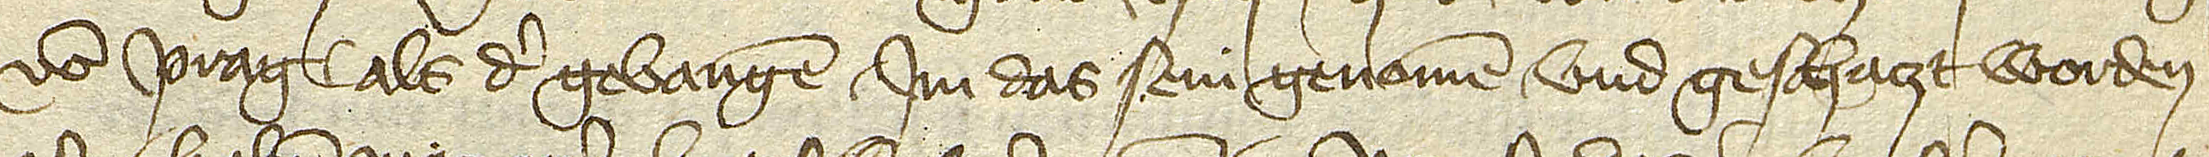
vo* Prag / als d* gevange* / Im das ſein genome* / vnd geſchacʒt worden
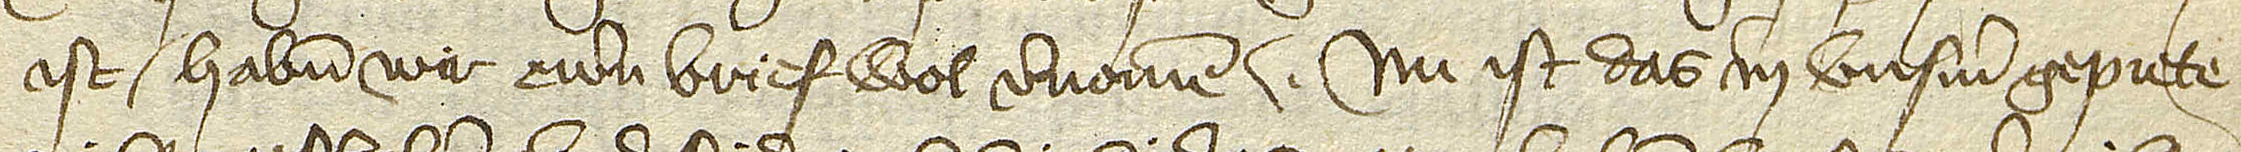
iſt / habn* wir ew*n brief wol v*nome* / . Nu iſt das in vnſm* gepiete
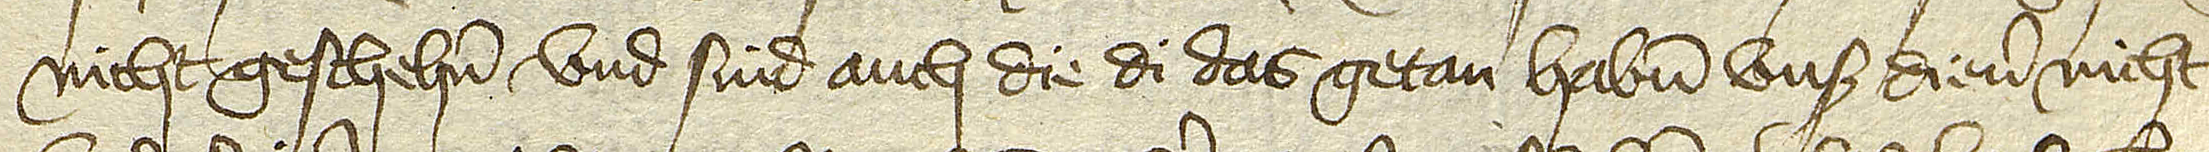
nicht geſchehn* / vnd ſind auch die di das getan habn* vnſ* dien* nicht
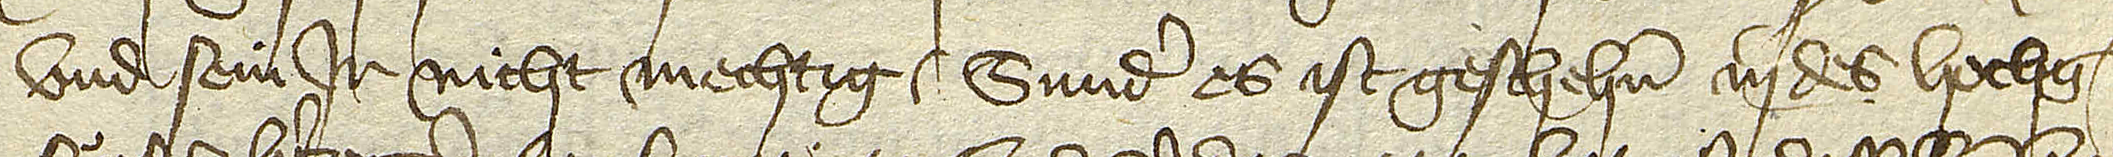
vnd ſein Ir nicht mechtig / Sund* es iſt geſchehn* in des hochg*
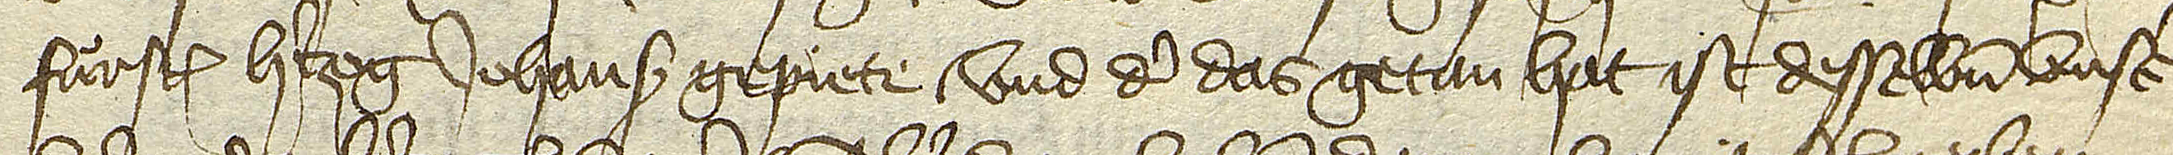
fürſt* h*cʒog Iohanſ* gepiete / vnd d* das getan hat iſt deſſelbn* vnſs*
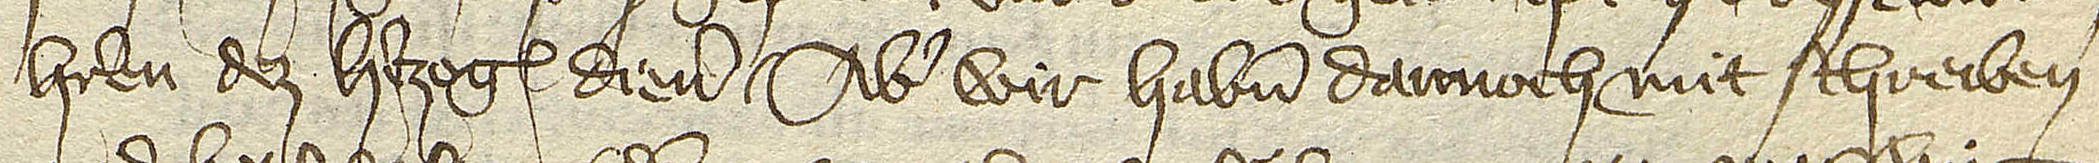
hr*en deʒ h*cʒog* dien* / Ab* wir habn* dannoch mit ſchreiben
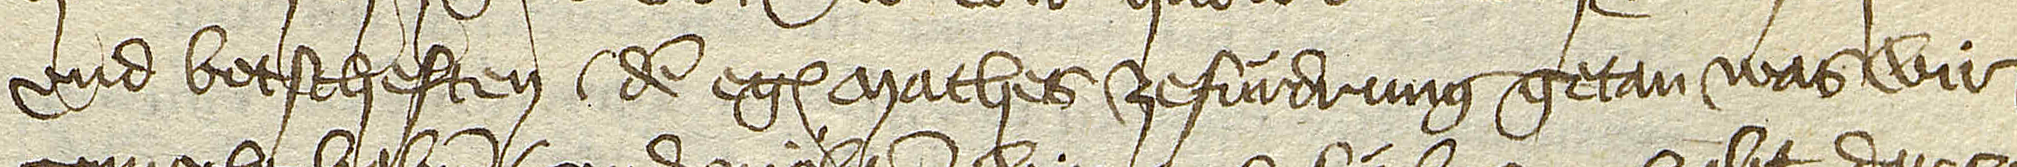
vnd botſcheften / d* eg* Mathes cʒefürdrung getan was wir
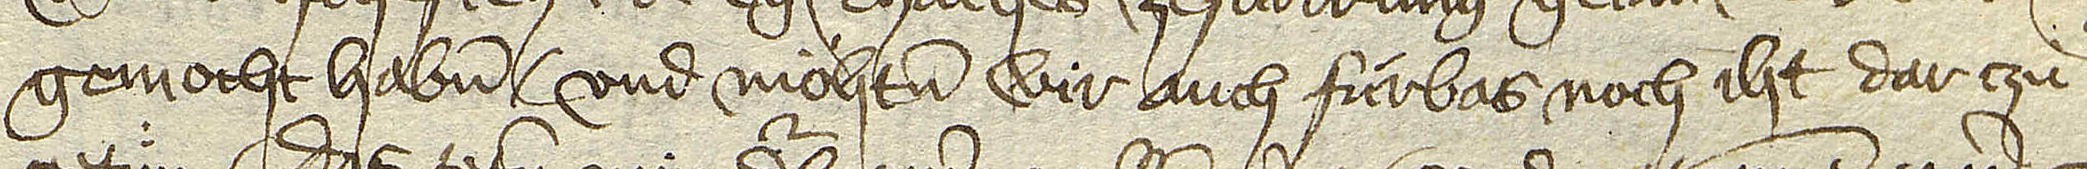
gemocht habn* / vnd möhtn* wir auch fürbas noch iht dar cʒü
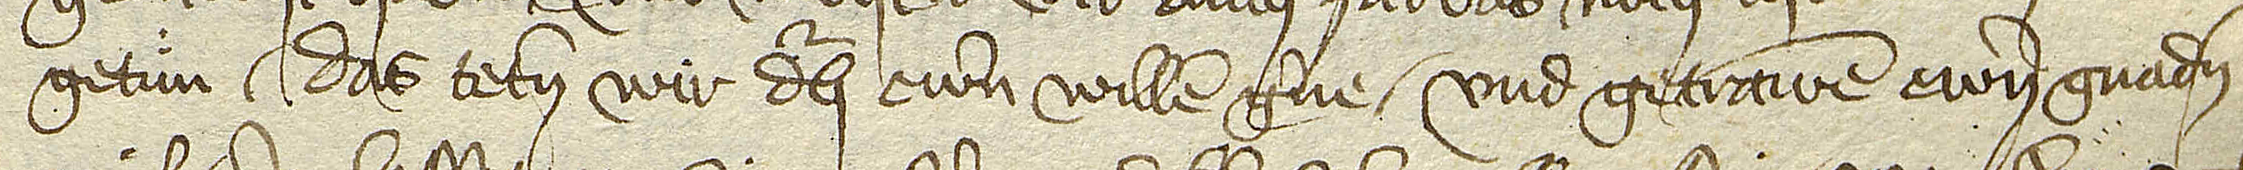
getün / das tetn* wir d*h ew*n wille* g*ne / vnd getrawe* ewn* gnadn*
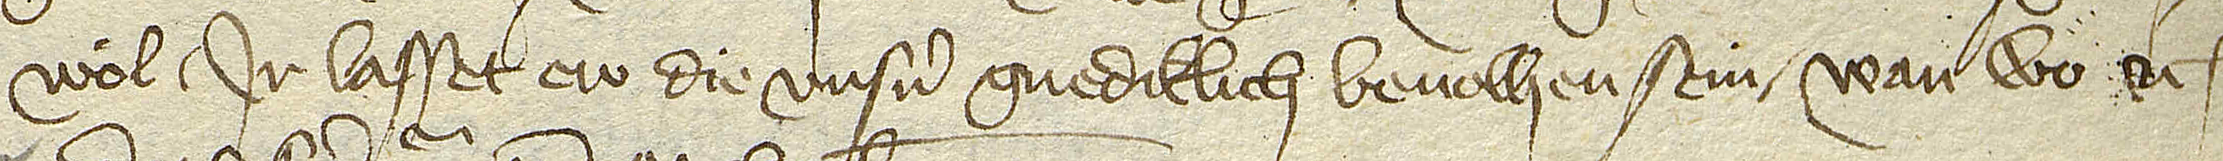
wol / Ir laſſet ew die vnſn* gnediklich beuolhen ſein / wan wo ec*
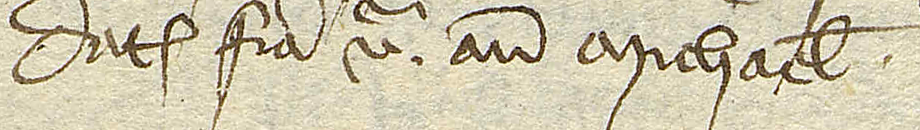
Dat* fia* v*. an* Michael* .
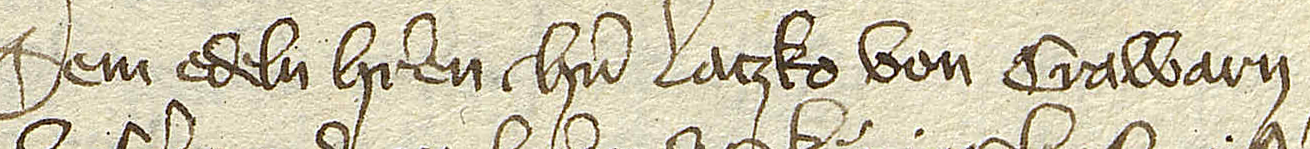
Dem edeln hr*en / hn* Lacʒko von Crawarn
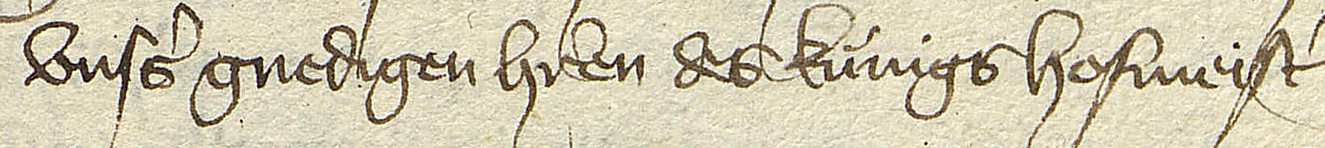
vnſs* gnedigen hr*en des künigs hofmeiſt*
